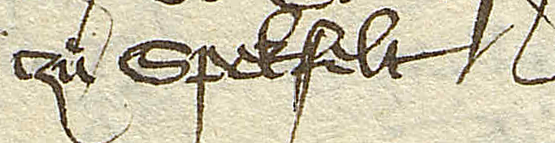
cʒü Spekfelt /
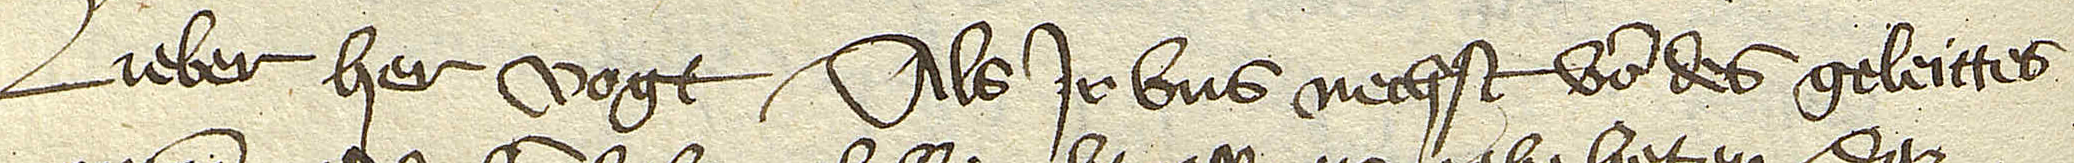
Lieber her vogt / Als Ir vns nechſt vo* des geleittes
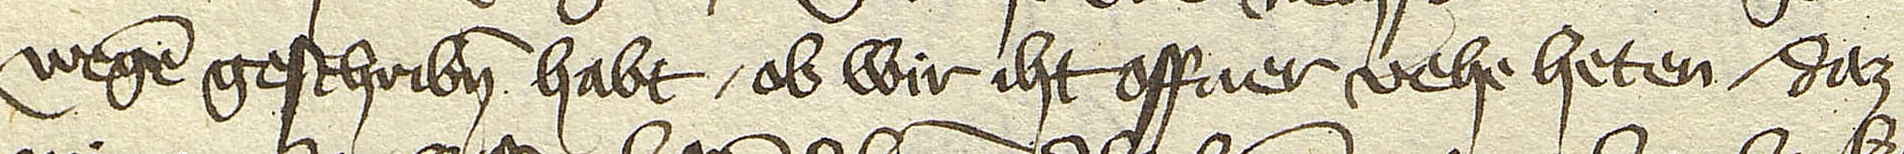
wege* geſchribn* habt / ob wir iht offner vehe heten / daʒ
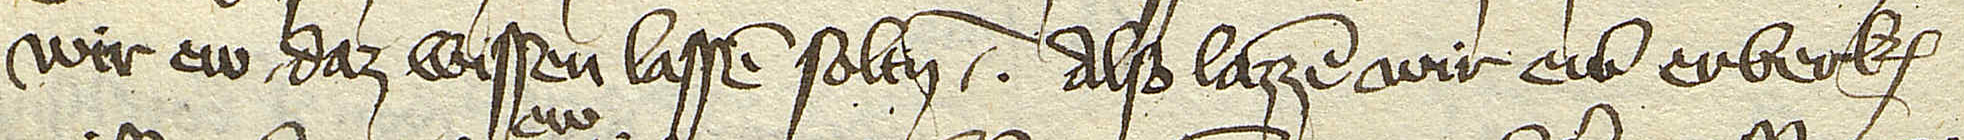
wir ew / daʒ wiſſen laſſe* ſoltn* / . Alſo laʒʒe* wir ew* erberk*
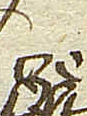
cʒe
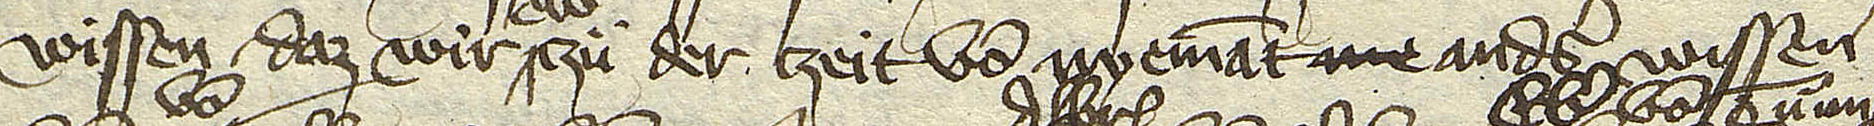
wiſſen / daʒ wir cʒü der cʒeit vo* nyemat* me ands* wiſſen
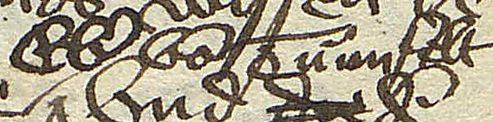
Eb* vo* Tümfelt
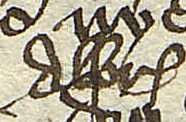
Albr*
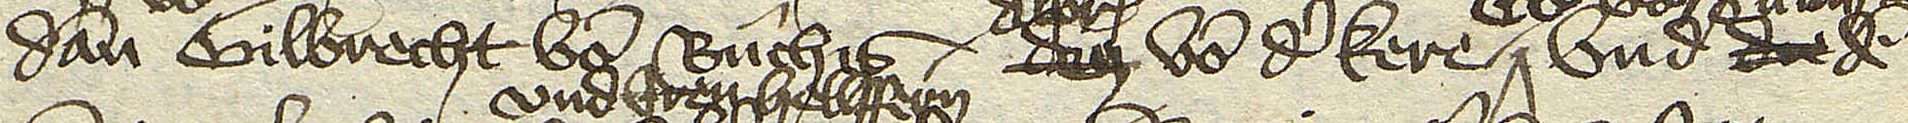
dan* Gilbrecht vo* Büchis / din vo* d* Kere / vnd die d*
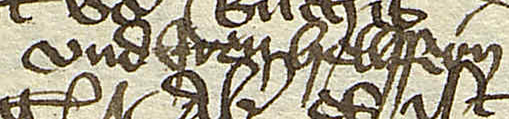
vnd Iren hellffern
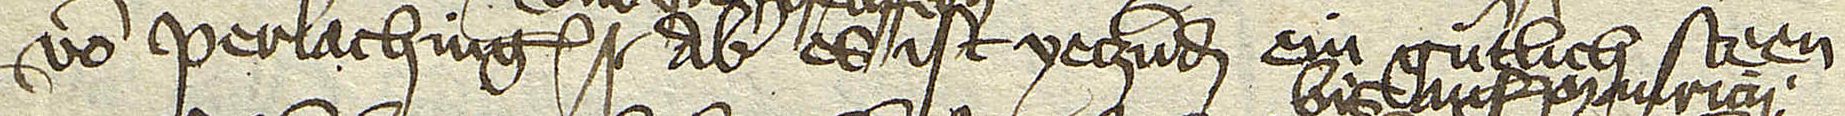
vo* Perlaching* / Ab* es iſt yecʒu*d* ein gütlich ſteen
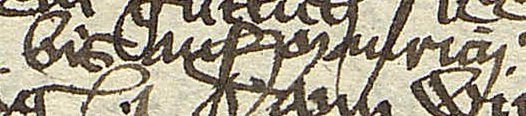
bis auf Mauricii*
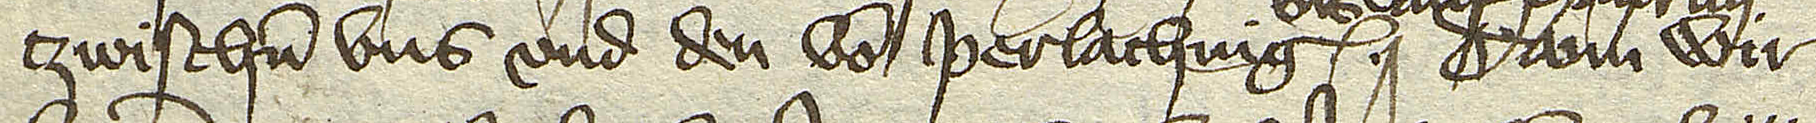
cʒwiſchn* vns vnd den vo* Perlaching* . Dann wir
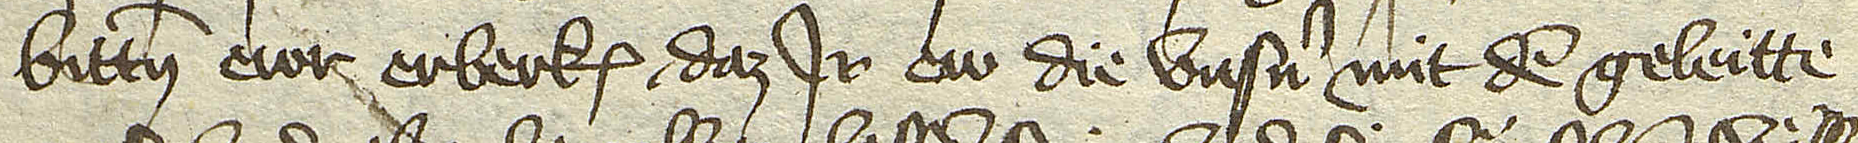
bittn* ewr erberk* / daʒ Ir ew die vnſn* mit d* geleitte
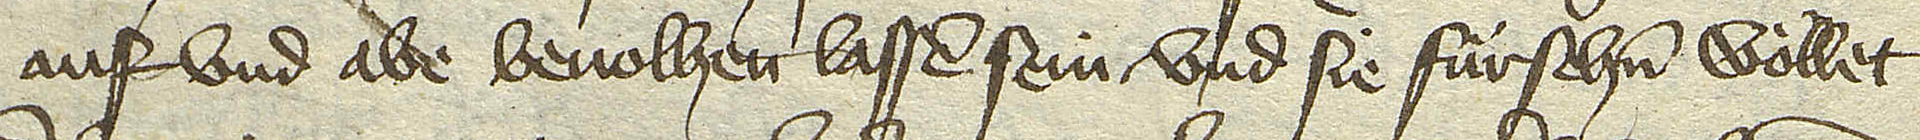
auf vnd abe beuolhen laſſe* ſein / vnd ſie fürſehn* wöllet
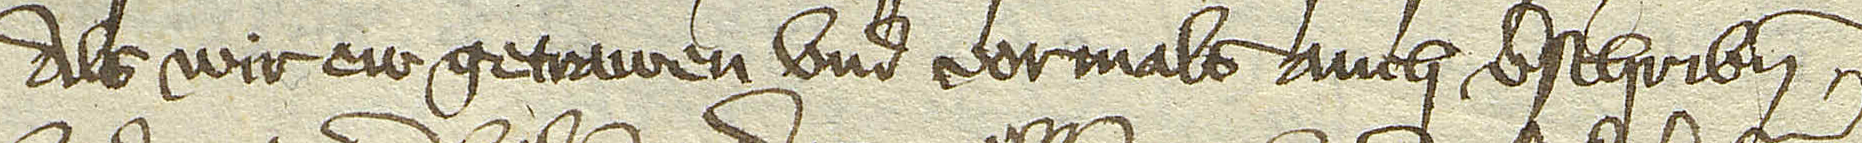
Als wir ew getrawen vnd vormals auch v*ſchribn*
